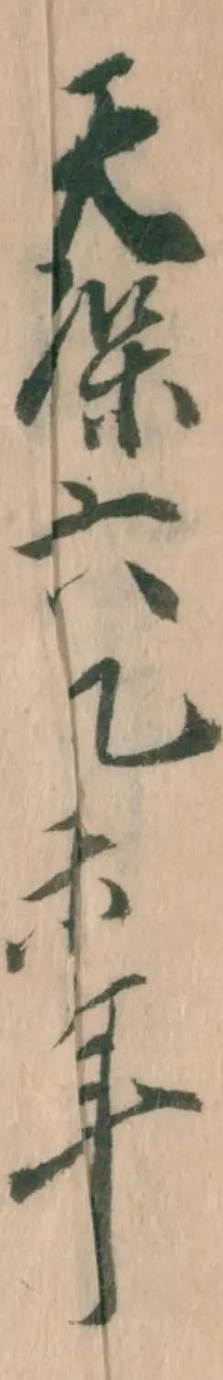天保六乙未年
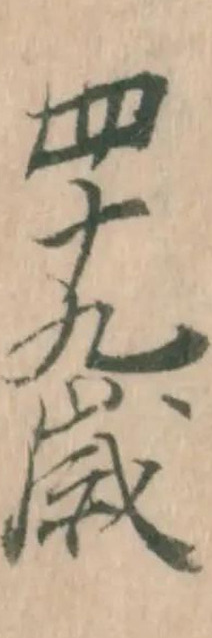四十九歳

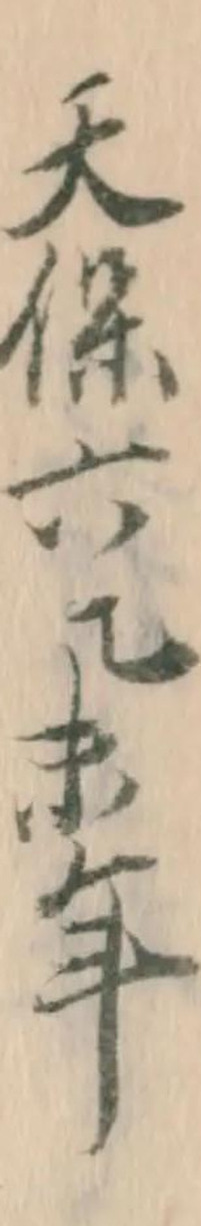天保六乙未年
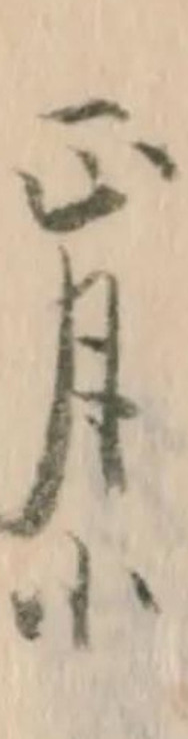正月小
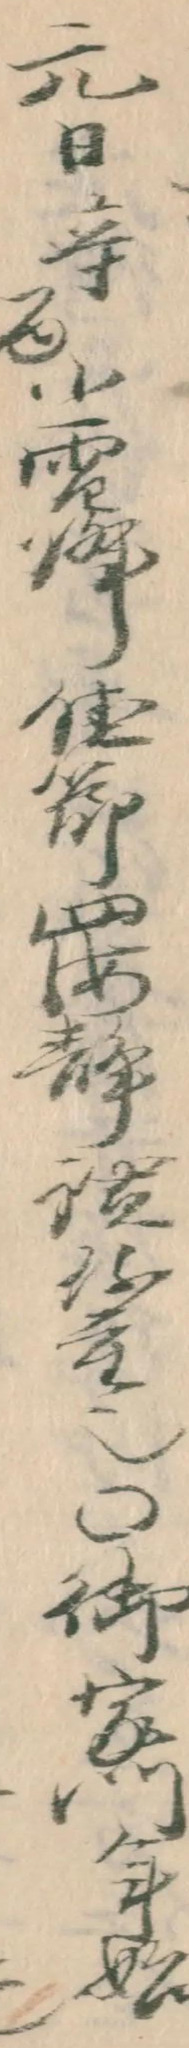元日辛酉小雹降佳節四海静謐珍重也○御家門年始
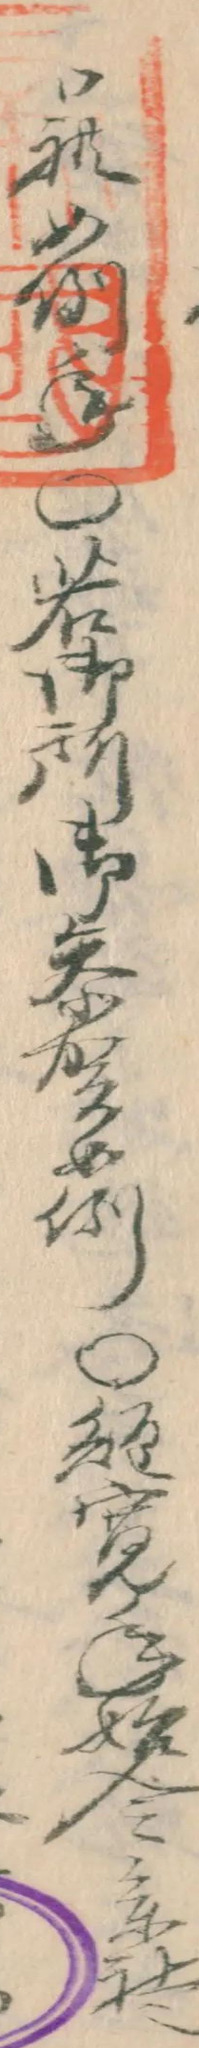御祝如例年○若御所御参賀如例○経寛年始令参社也
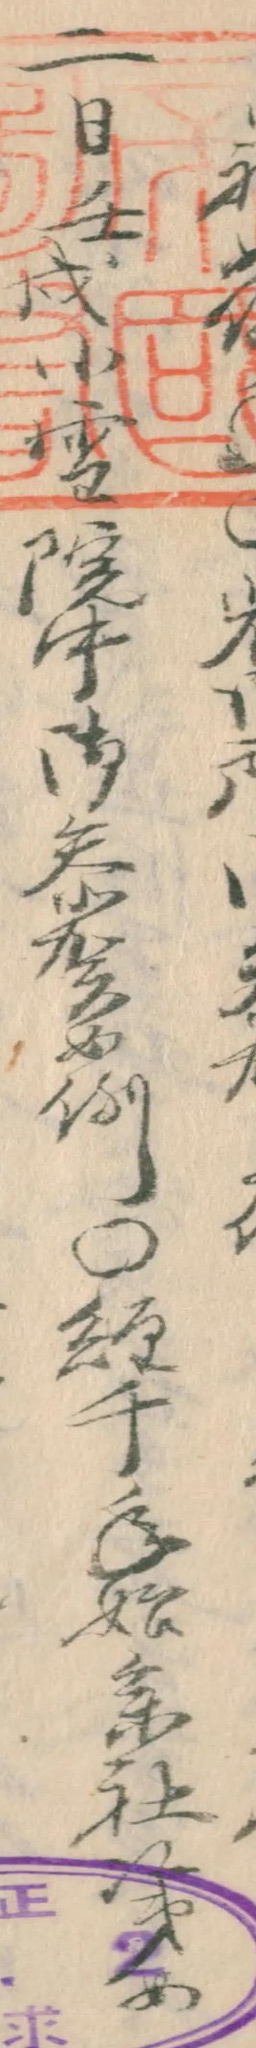二日壬戌小雪院中御参賀如例〇経千年始参社次第如
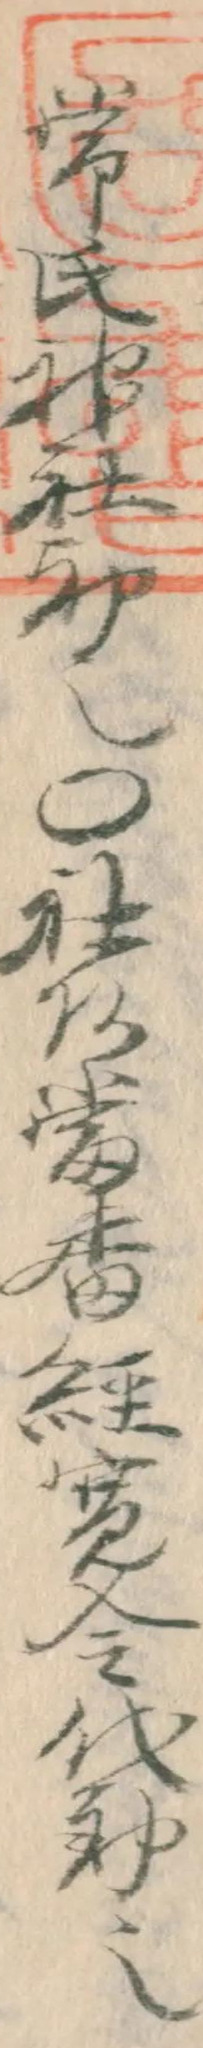常氏神社初也〇社頭當番経寛令代勤也
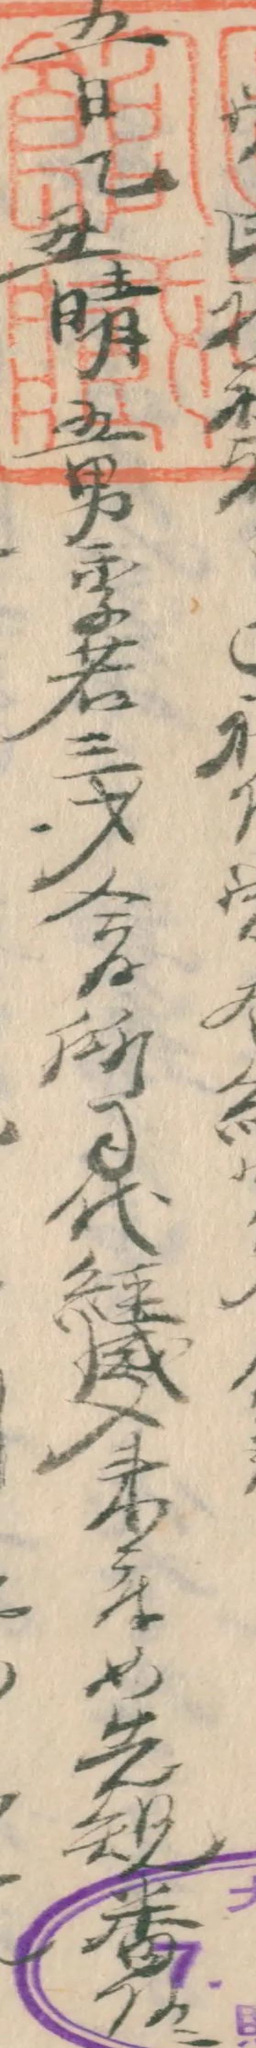五日乙丑晴五男季若三才今日所司代経威入来ニ付如先規番頭
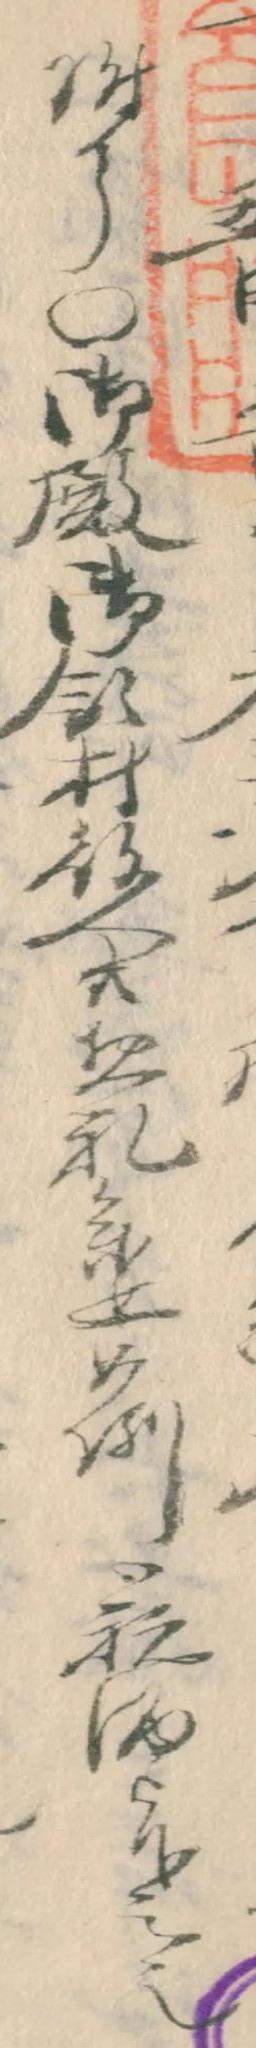附了〇御殿御領村役人共惣礼参上如例御祝酒被下之也
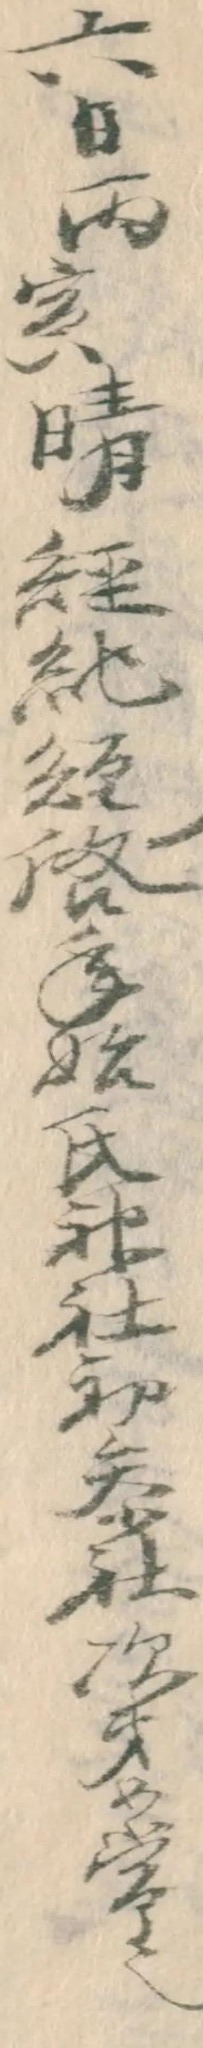六日丙寅晴経紀経啓年始氏神社初参社次第如常也
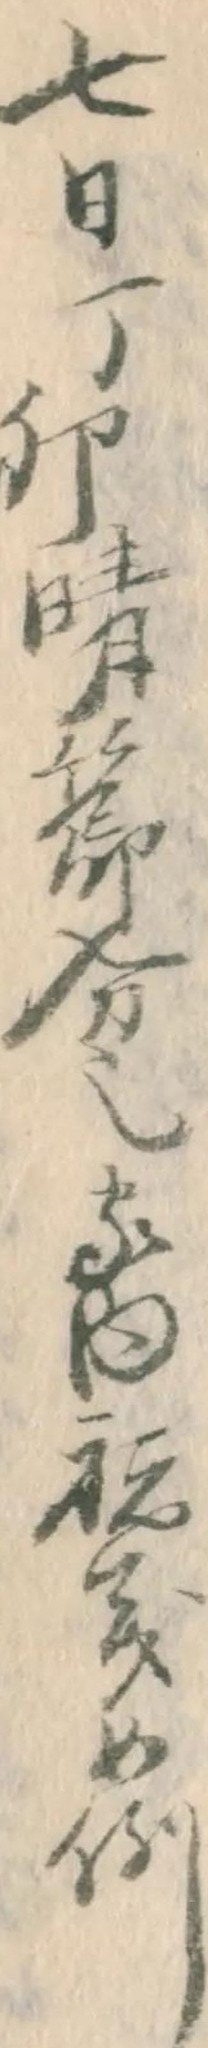七日丁卯時節分也家内祝義如例
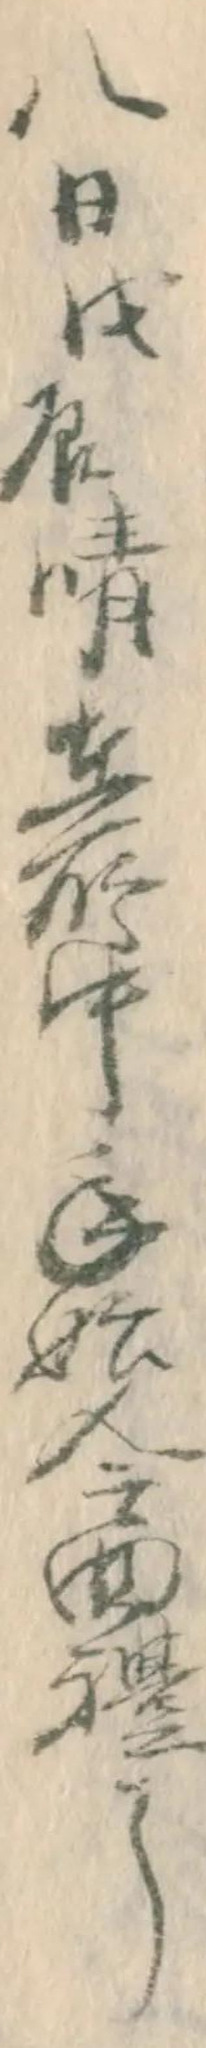八日戊辰晴在所中年始令回禮了
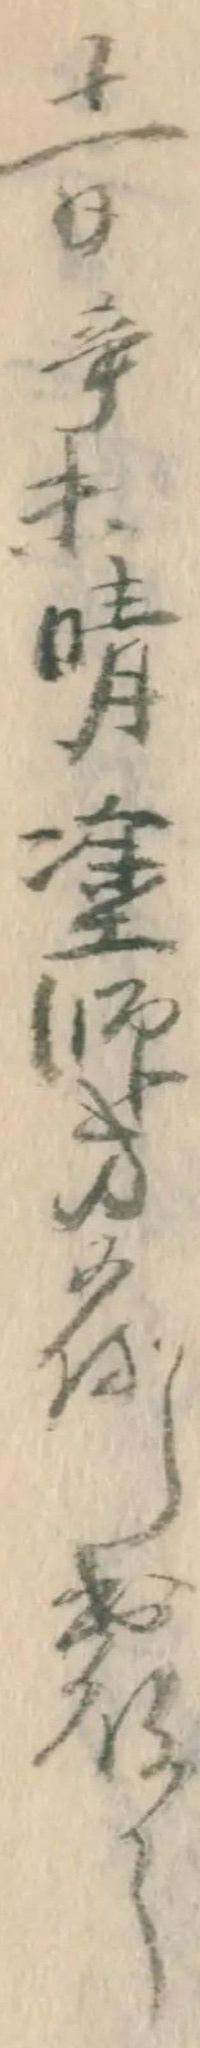十一日辛未晴塗師方如例出役了

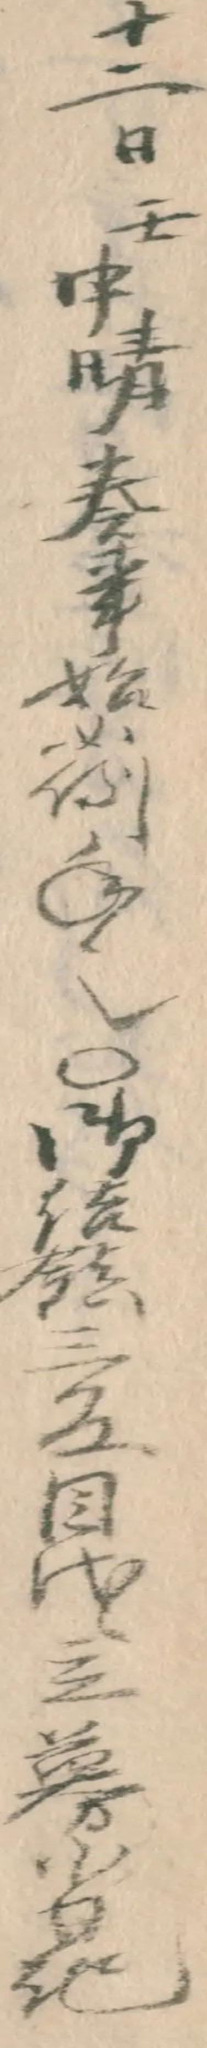十二日壬申晴奏事始如例年也〇御結鎮三反目代へ立募小日記
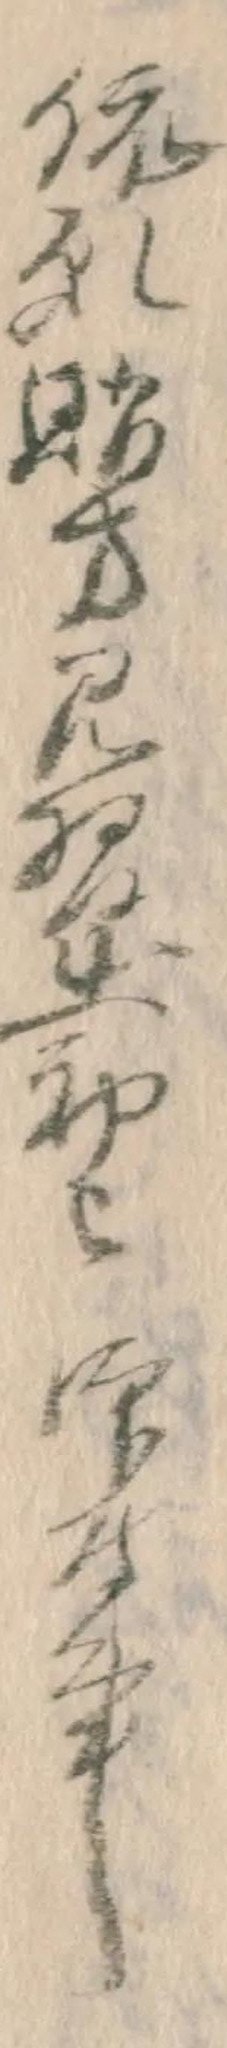依願賄方見習出勤被仰付事
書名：賀茂社記録. 第67冊
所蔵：国立国会図書館 National Diet Library, JAPAN
